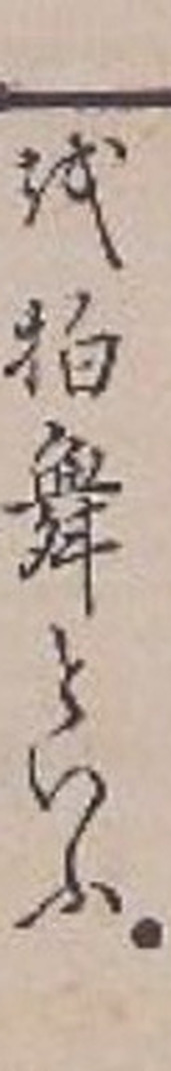を拍舞といふ、
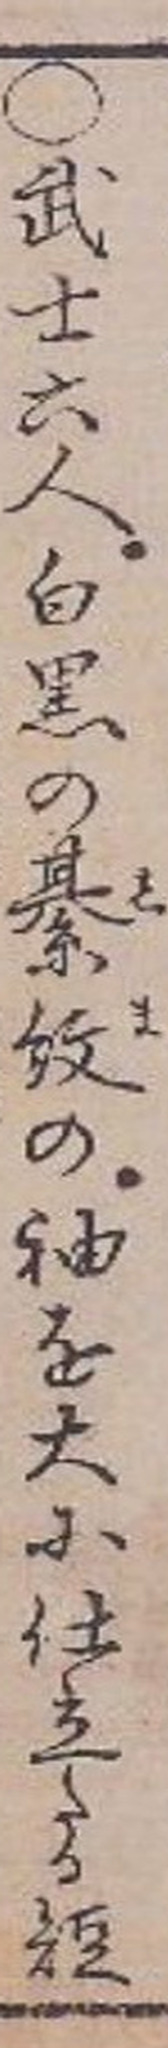〇武士六人、白黒の綦紋の、袖を大小仕立たる短
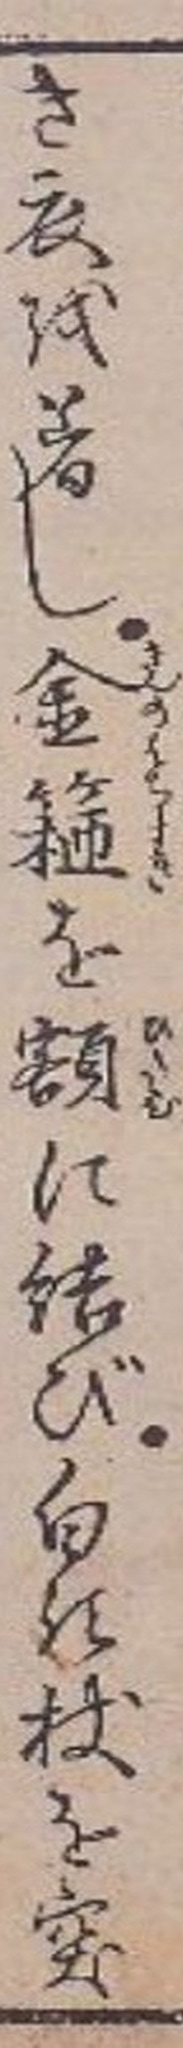き衣を着し、金箍を額に結び、白き杖を突
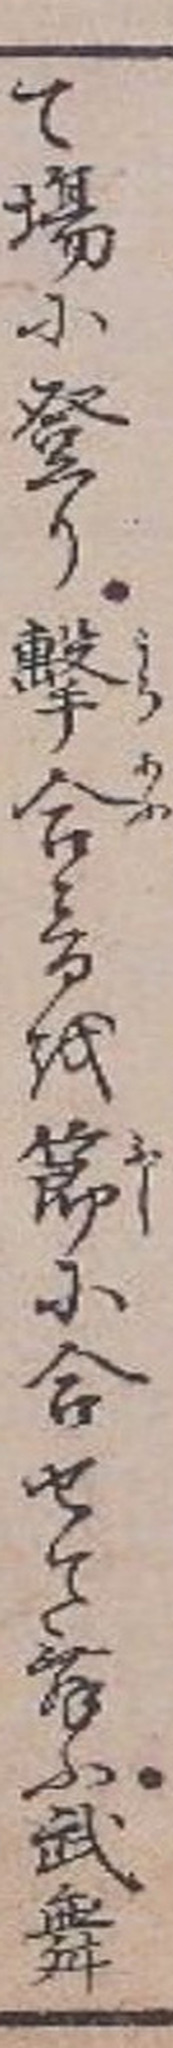て場に登り、撃合音を節に合せて舞ふ、武舞
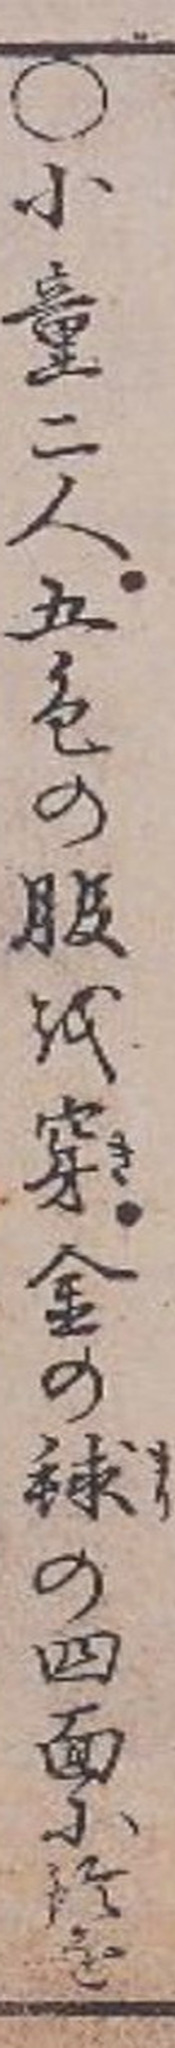〇小童二人、五色の服を穿、金の毬の四面に鈴を
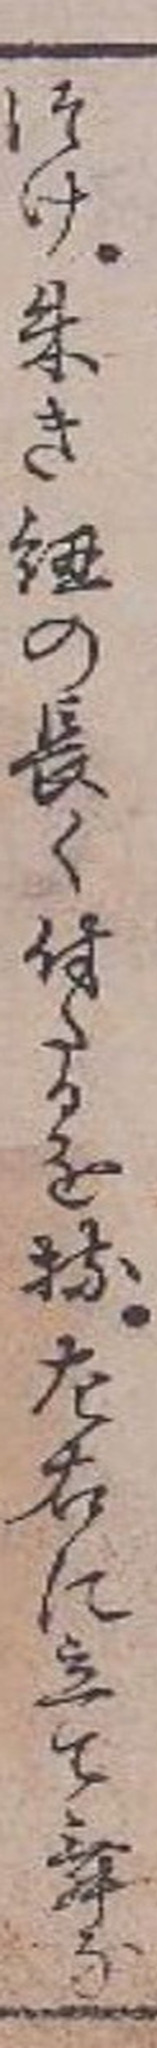つけ、朱き紐の長く付たるを持、左右に立て舞な
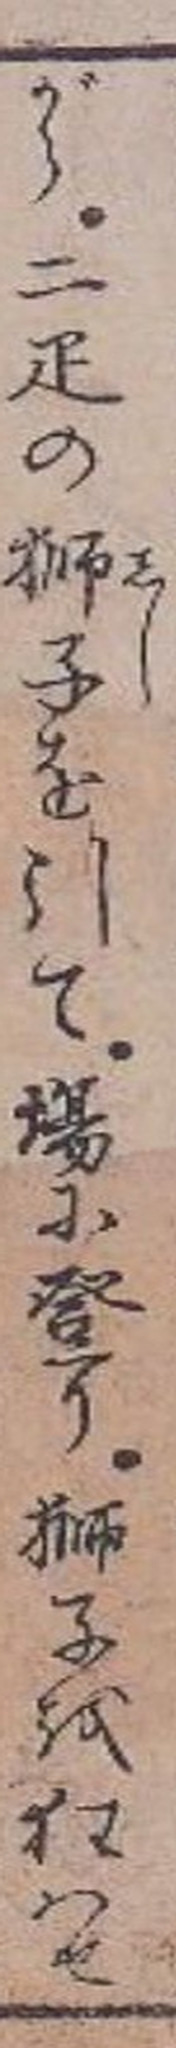がら、二疋の獅子を引て、場に登り、獅子を狂はせ

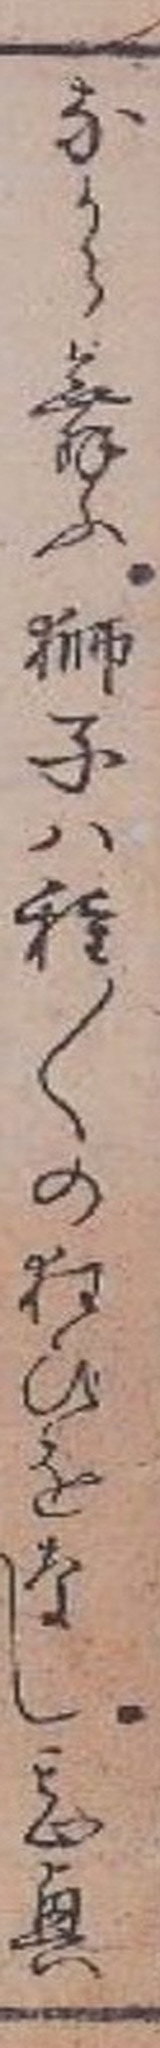なから舞ふ、獅子は種〳〵の狂ひをなし、甚興
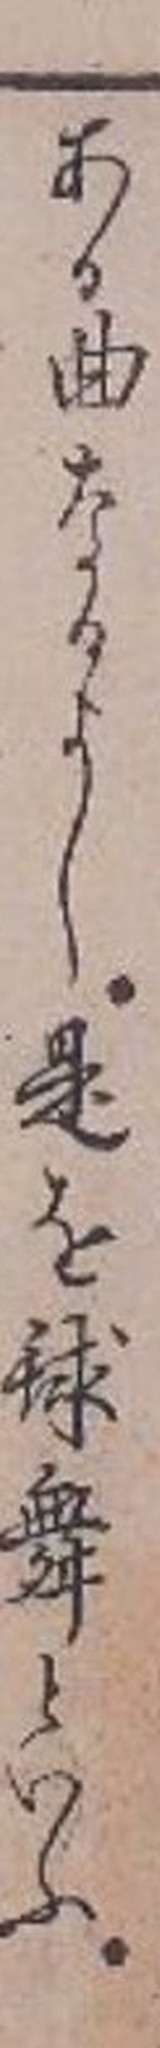ある曲なるよし、是を毬舞といふ、
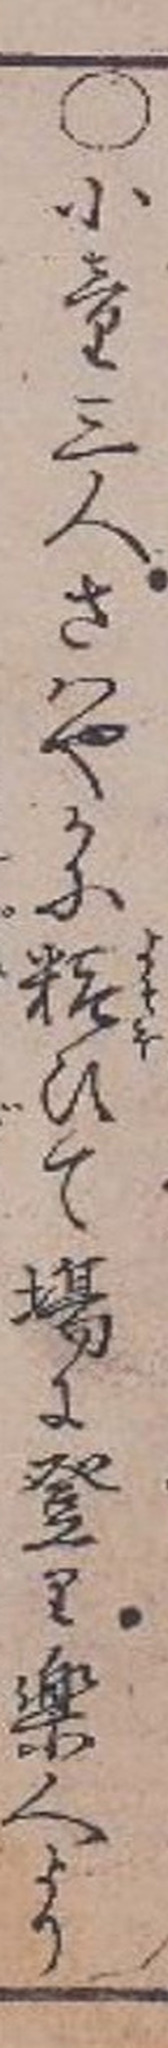〇小童三人、さはやかに粧ひて場に登り、楽人より
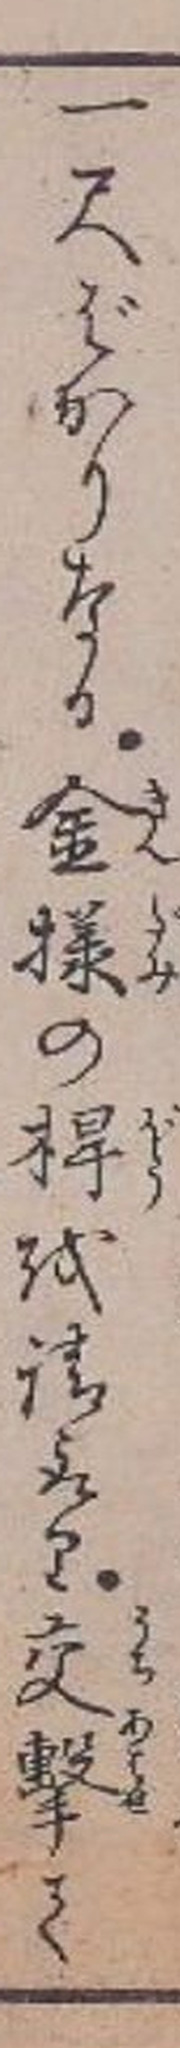一尺ばかりなる、金様の桿を請取り、交撃て
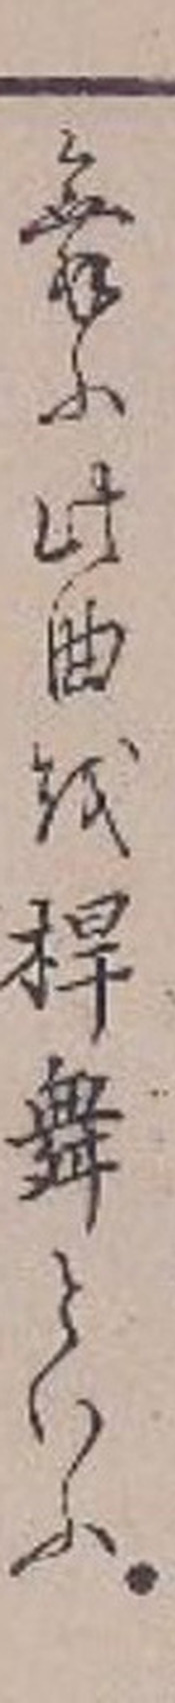舞ふ此曲を桿舞といふ、
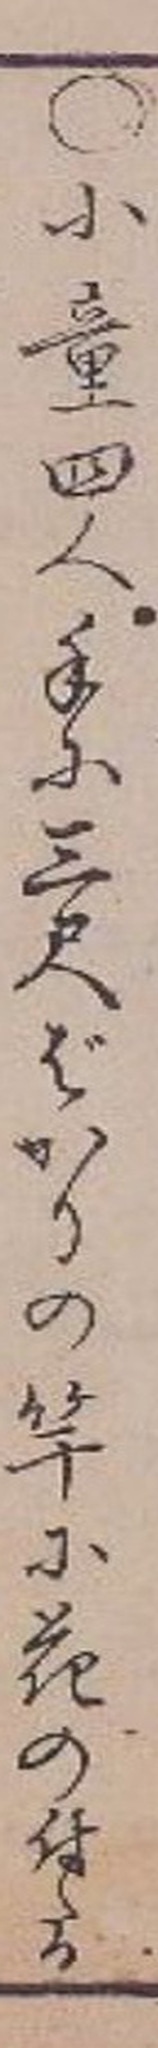〇小童四人、手に三尺ばかりの竿に花の付たる
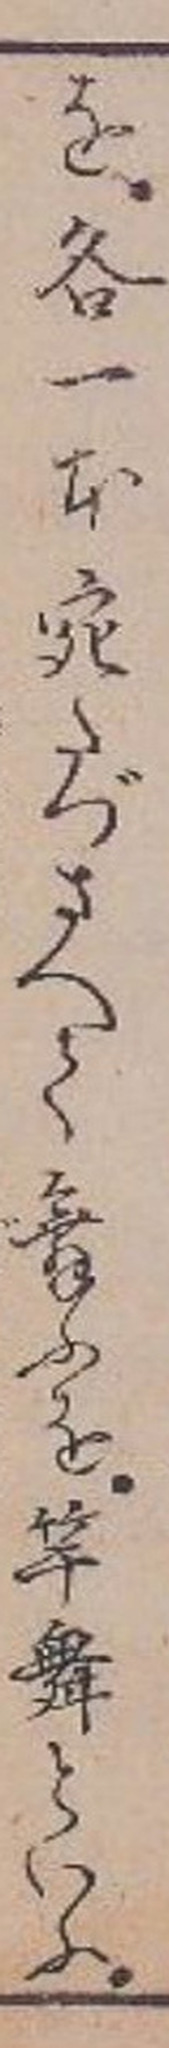を、各一本宛たづさへて舞ふを、竿舞といふ、
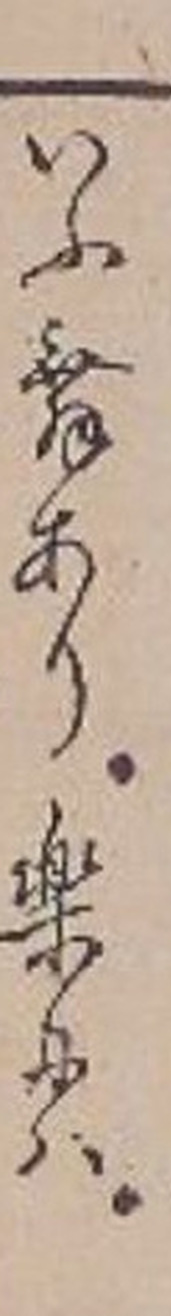いふ舞あり、楽には、
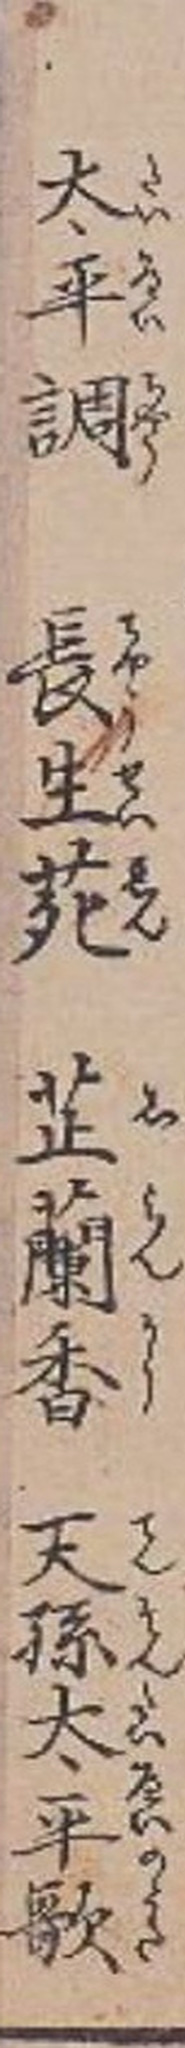太平調長生苑芷蘭香天孫太平歌
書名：琉球談
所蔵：University of the Ryukyus Library
